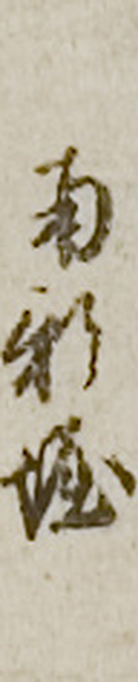南新堀
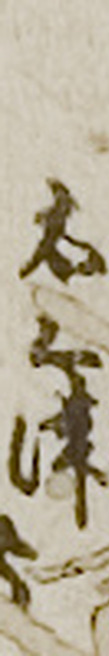大三津
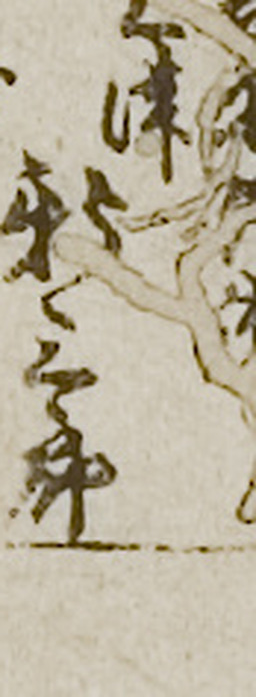喜三郎
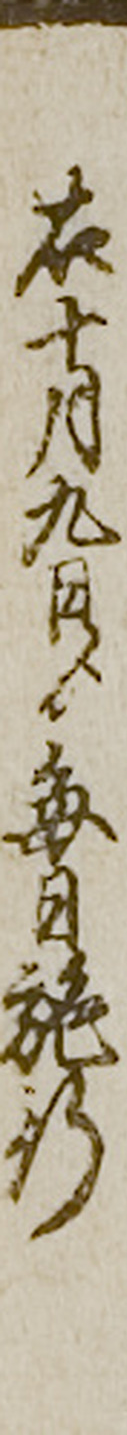右十月九日より毎日施行
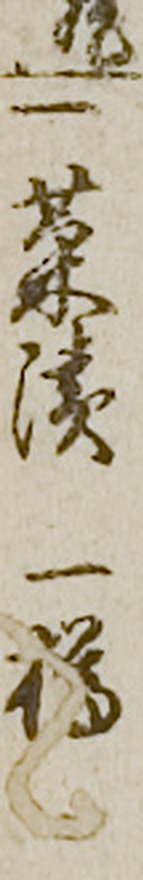一菜漬一樽
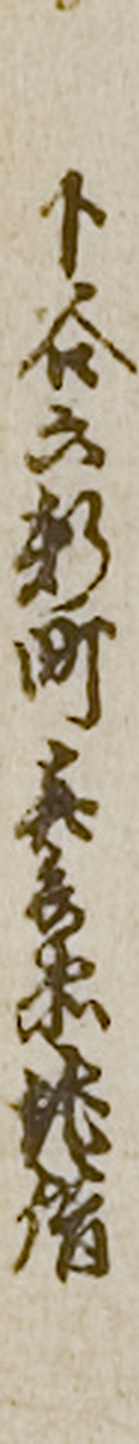下谷六軒町真兵衛地借
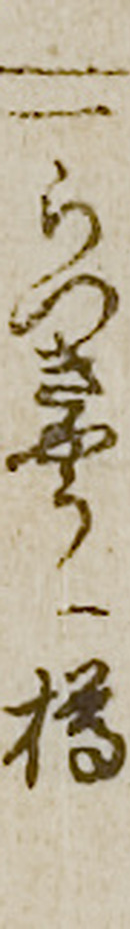一らつきやう一樽
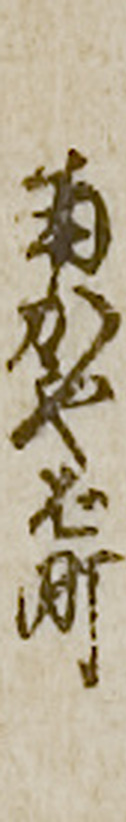南かやば町
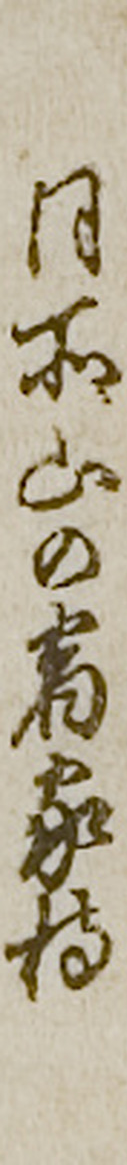同所山の宿家持
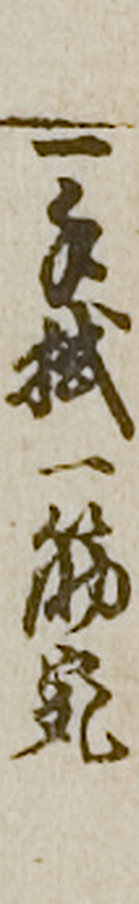一手拭一筋宛
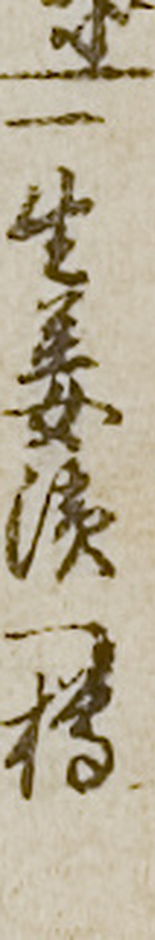一生姜漬一樽
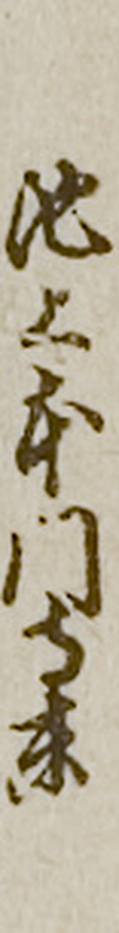池上本門寺末
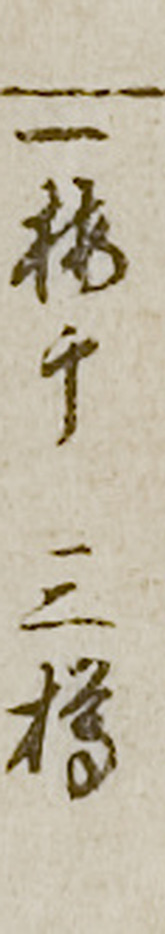一梅干三樽
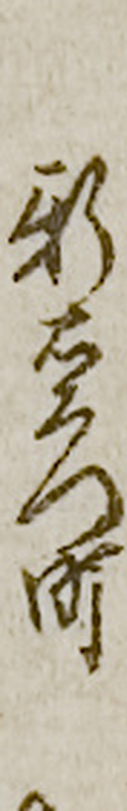新右衛門町
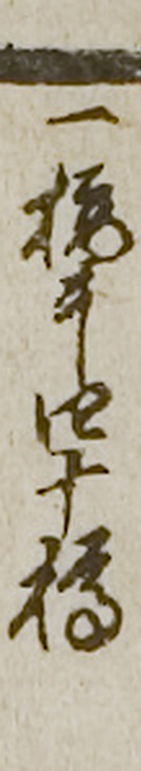一梅干四十樽
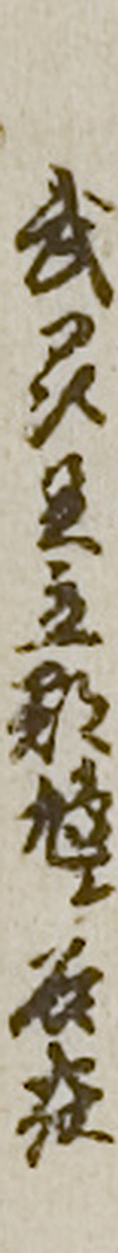武州足立郡鳩ケ谷在
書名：地震出火御救小屋施行名前附
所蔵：東京大学総合図書館 General Library in the University of Tokyo, JAPAN
